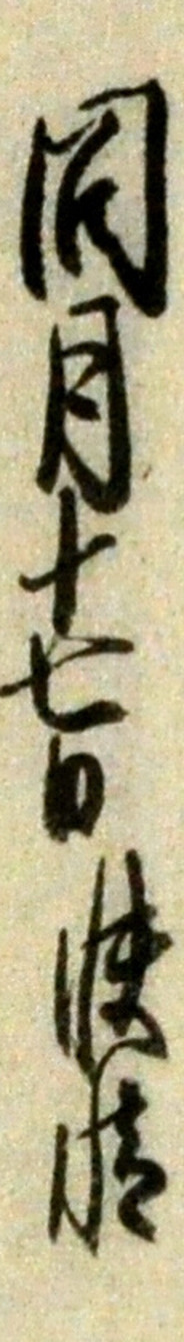同月十七日快晴
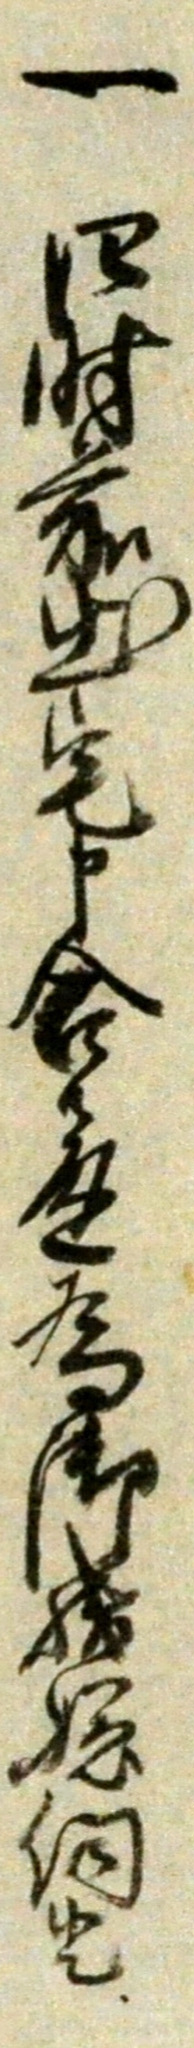一四時前出宅申合候通為御機嫌伺登
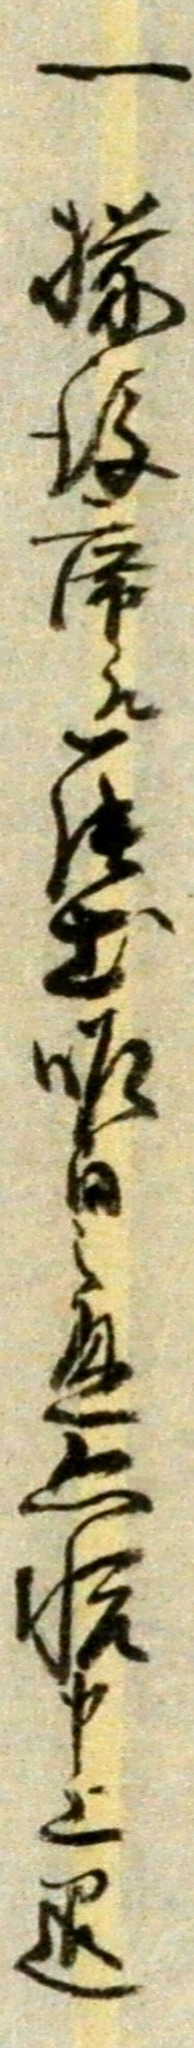一揃後席え罷出昨日之通恐悦申上退
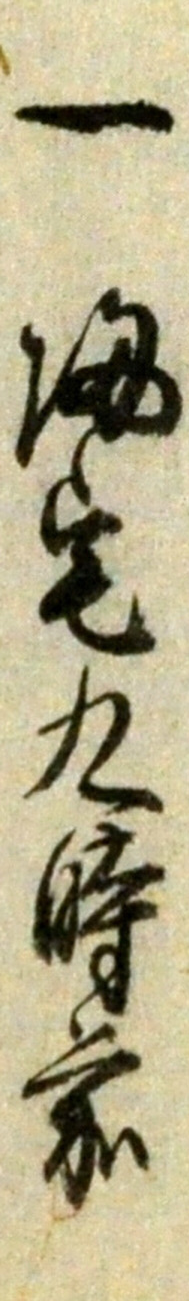一帰宅九時前
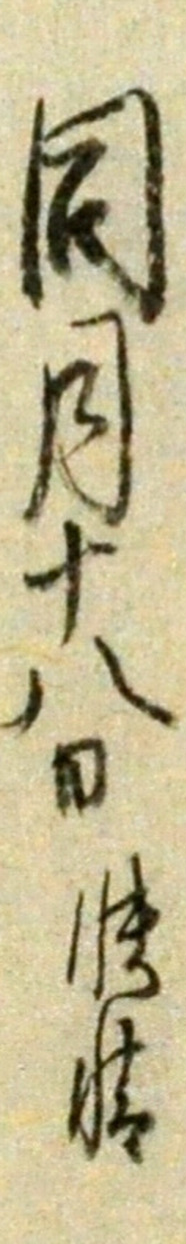同月十八日快晴
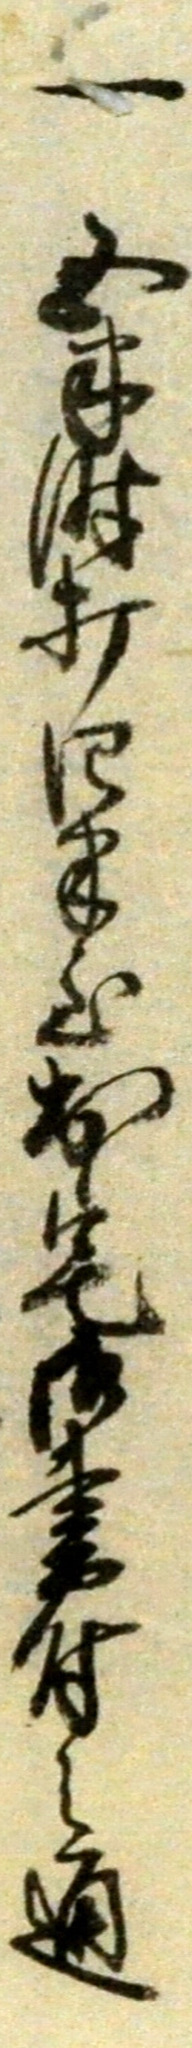一五半時打四半至出宅御書付之通

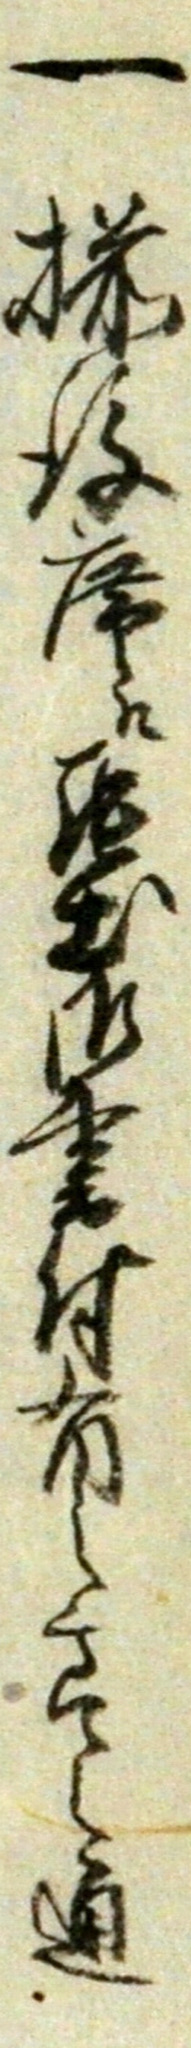一揃後席え罷出御書付有之節之通
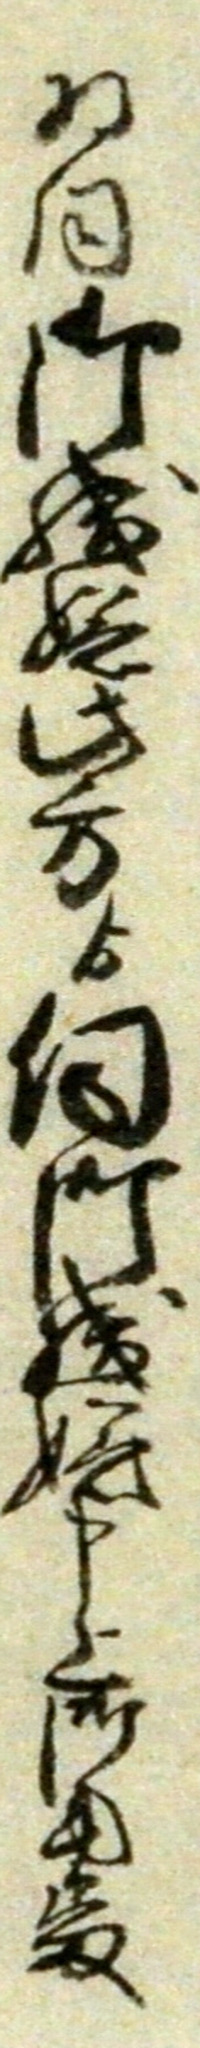為伺御機嫌此方ゟ伺御機嫌申上御用番
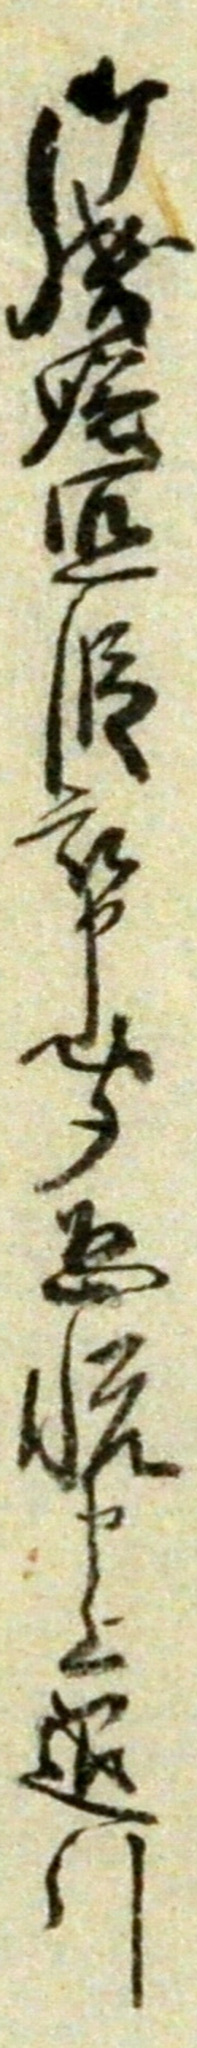御機嫌宜段被申聞恐悦申上退引
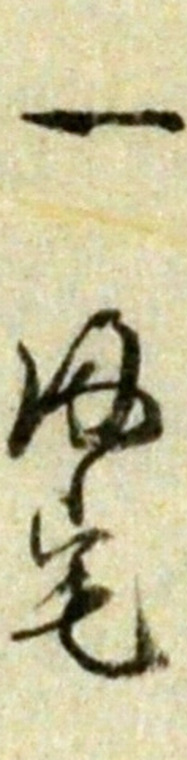一帰宅
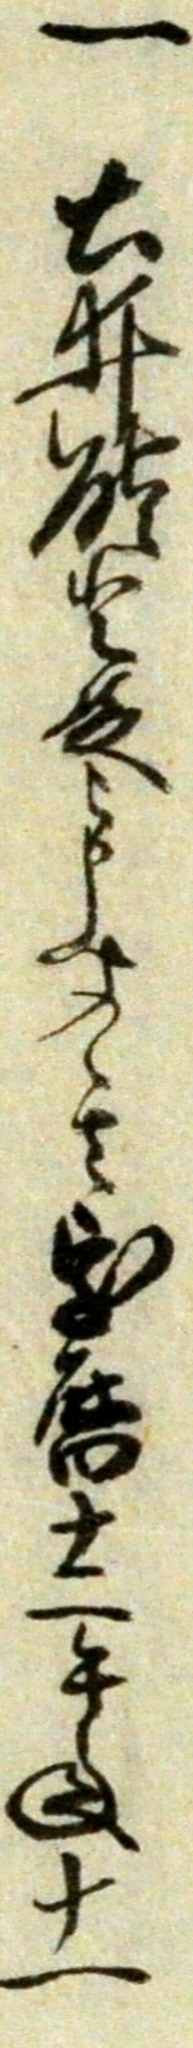一土井能登殿被申聞候は宝暦十二午年十一
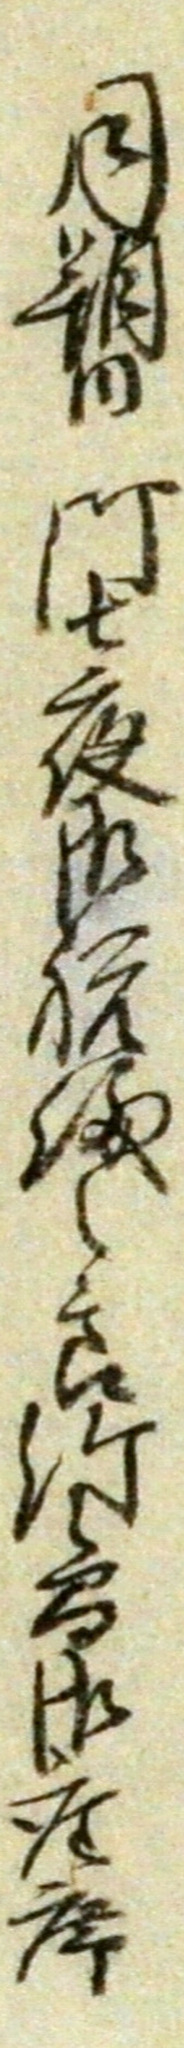月朔日御七夜御祝儀之節竹之間御座席
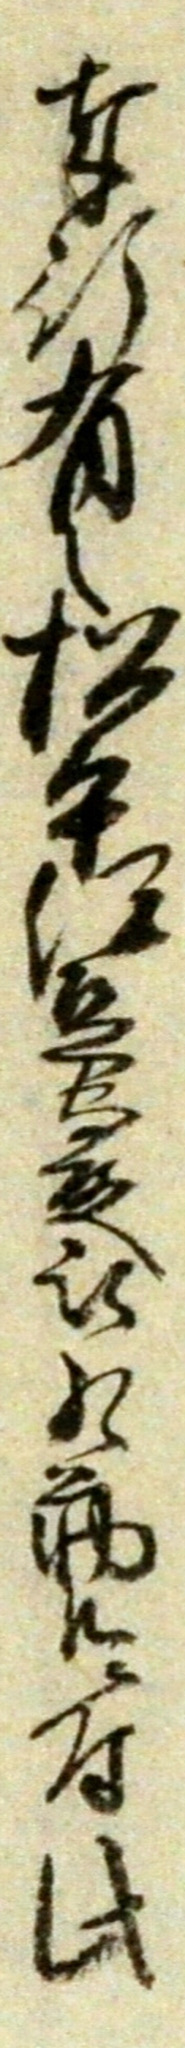奉行有之松平伊豆守殿被相勤候ニ付此
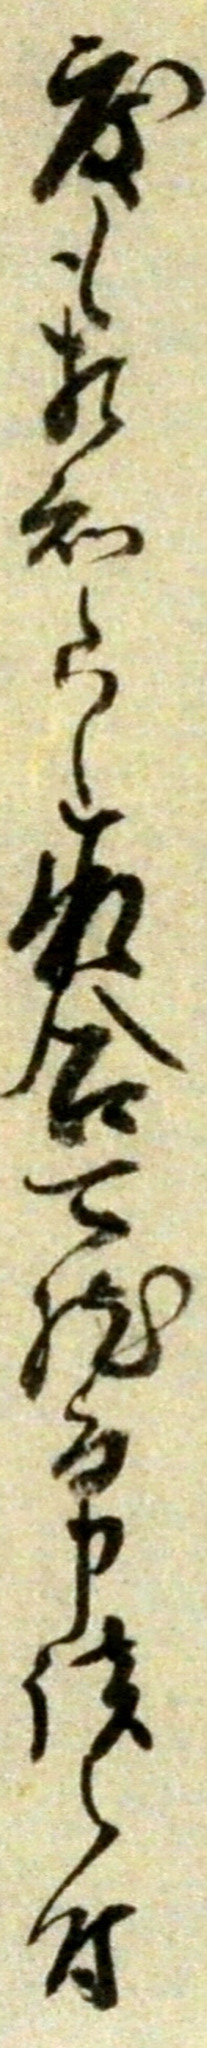度も相知候はゝ承合可然旨申談候付
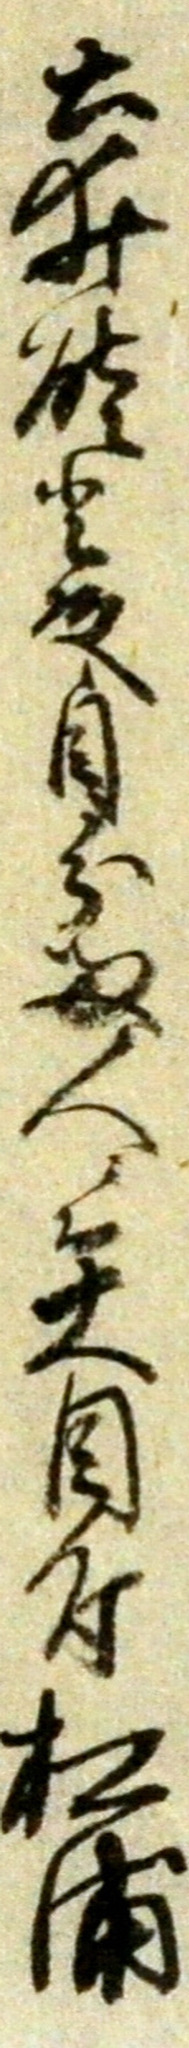土井能登殿自分両人ニ而大目付松浦
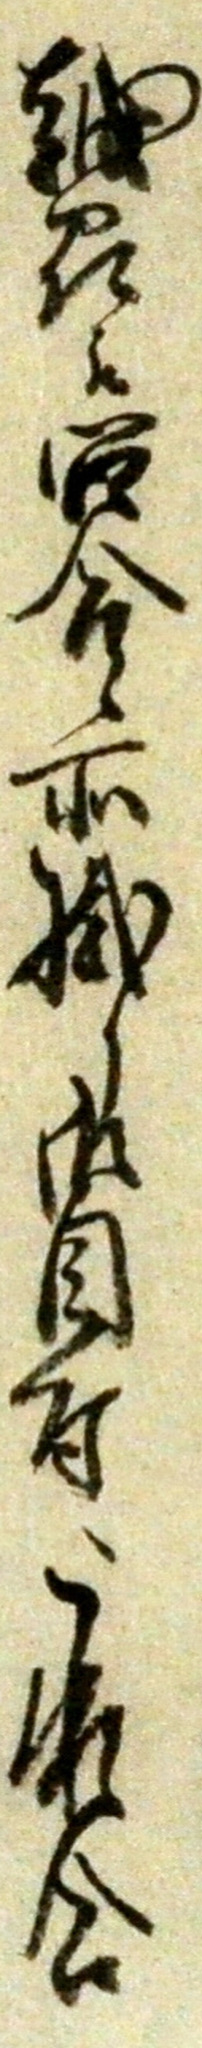越州え問合候所掛り御目付へ承合
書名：若君様（家斉嫡男）誕生諸祝儀ノ節ノ留書外
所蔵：伊那市立高遠町図書館・合同会社AMANE
